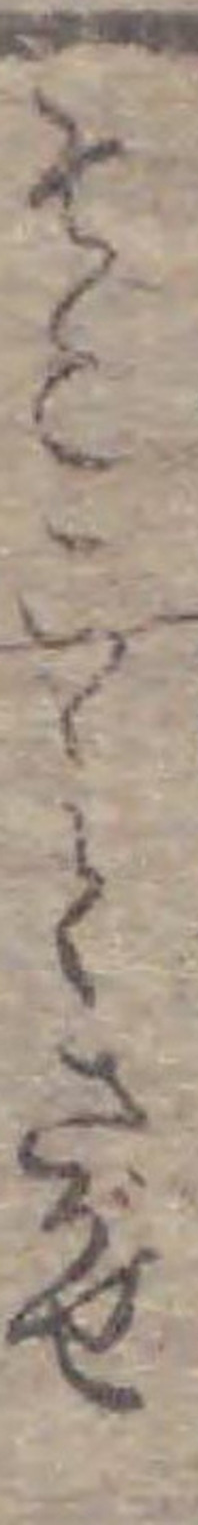そここゝとさがせ
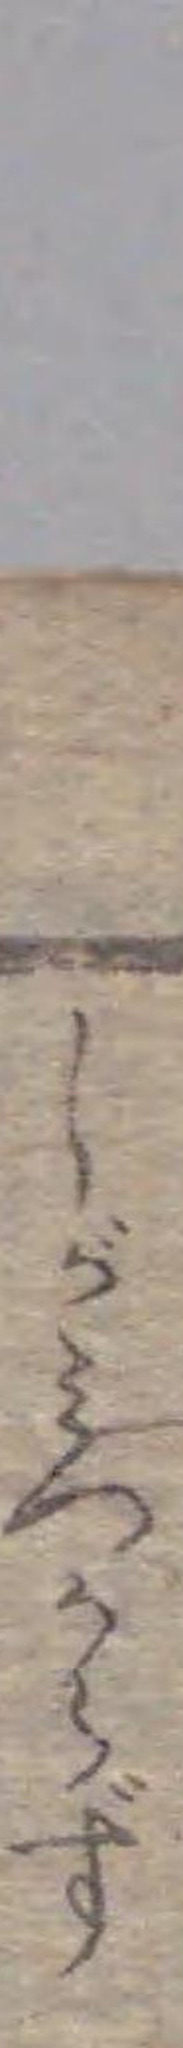しがみつからず
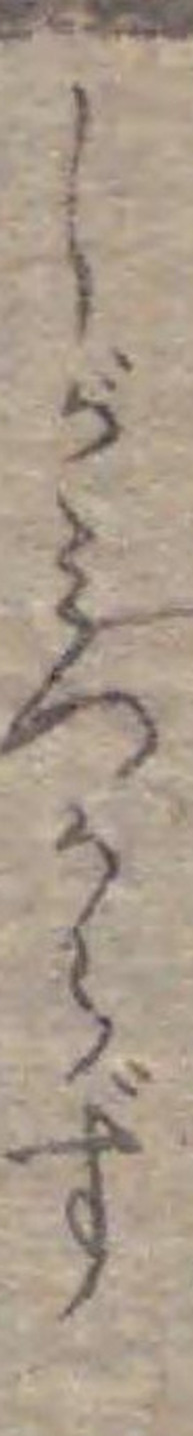しがみつからず
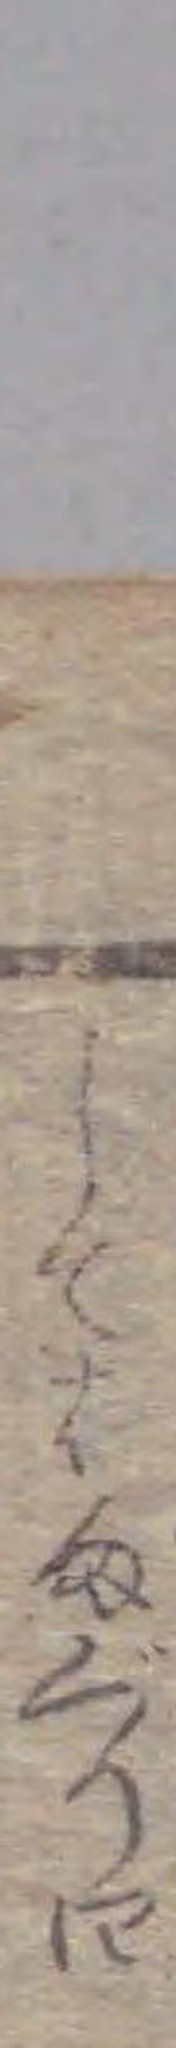してはまぐり四
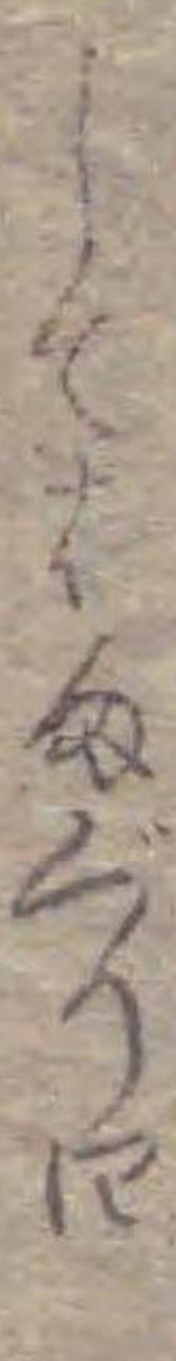してはまぐり四
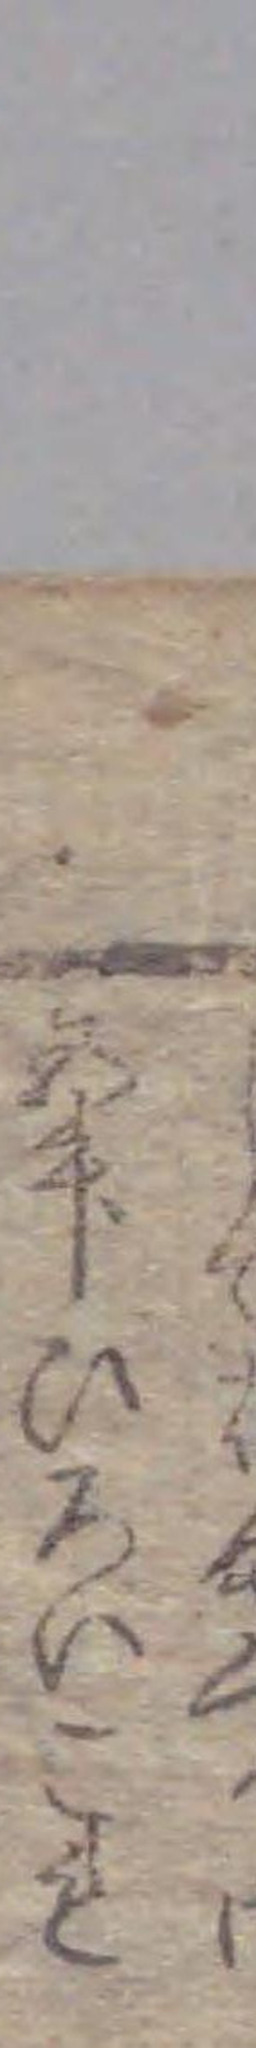五升ひろこれ
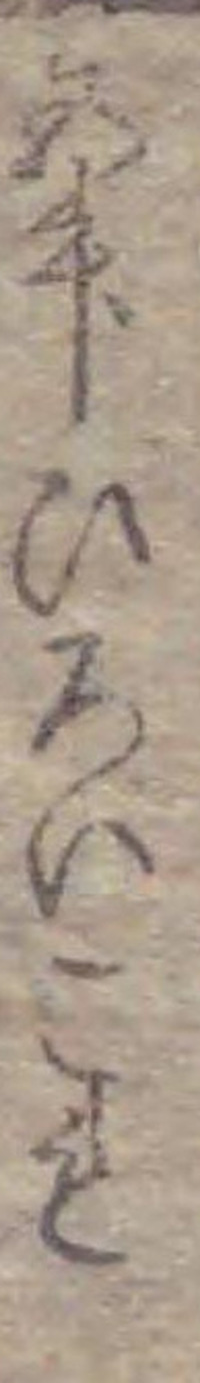五升ひろこれ

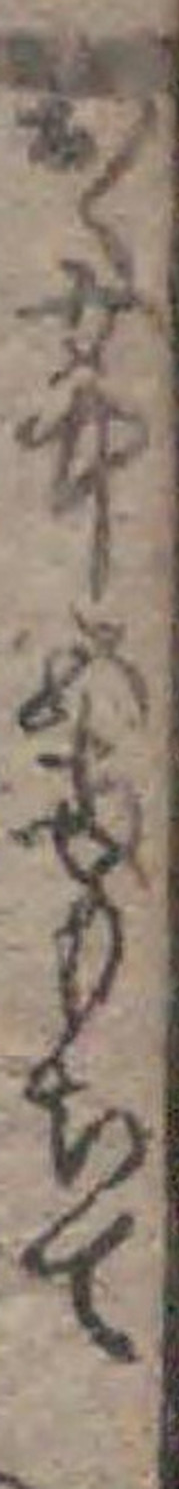おく女中五両もちて
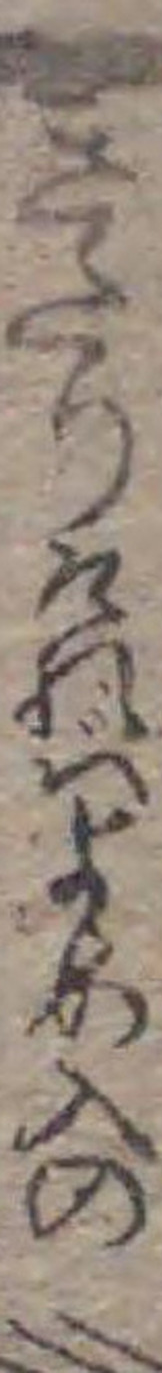きたりければよめ入の
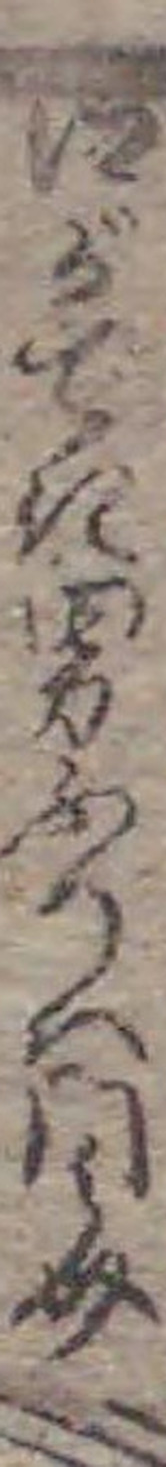口がてき男ふりは門之介
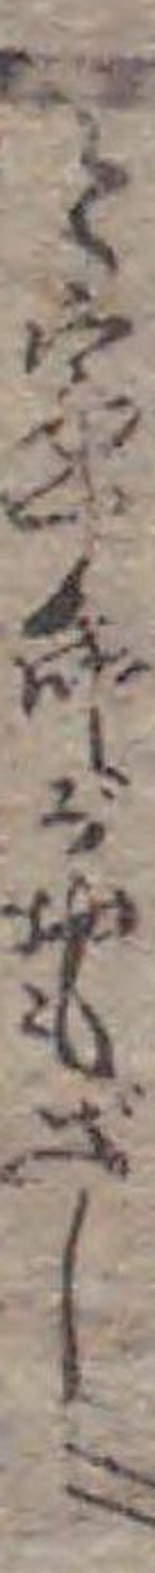と宗十郎がおもざし
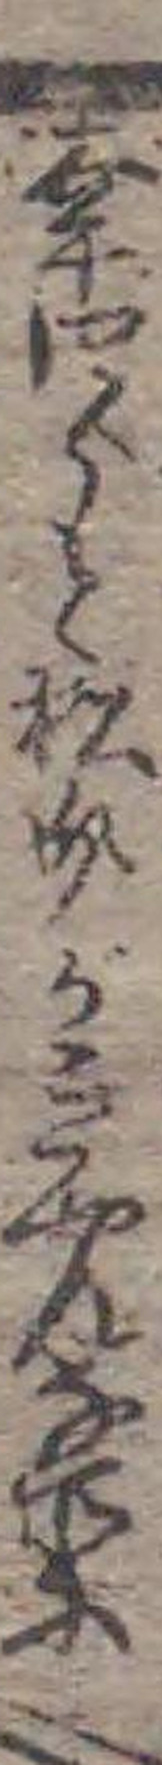幸四郎と松介がきやんな所に
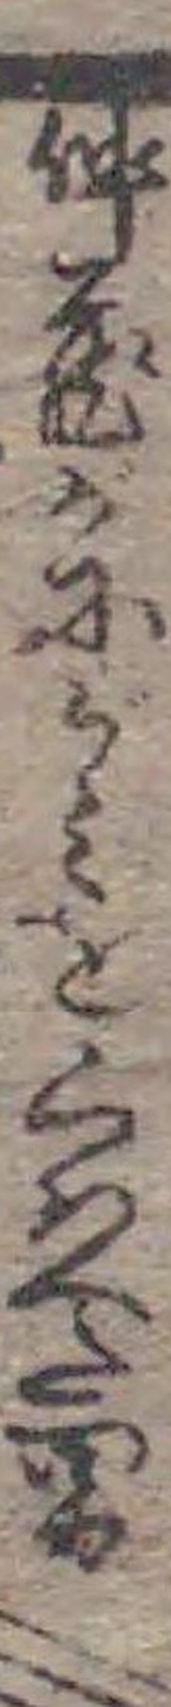仲蔵がにがみをくはへた男
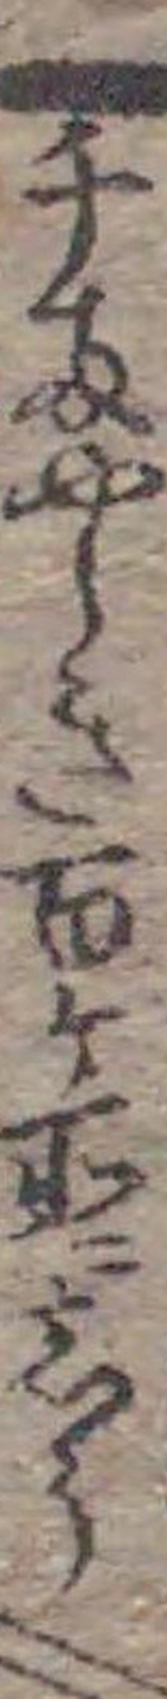千両やしき百ヶ所にしう
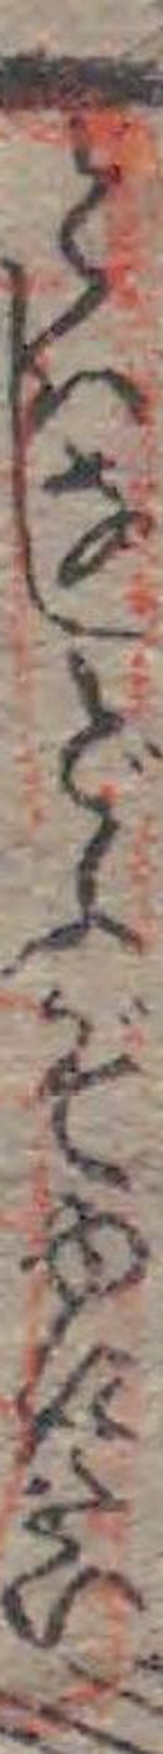とはなしどふぞゆきたい
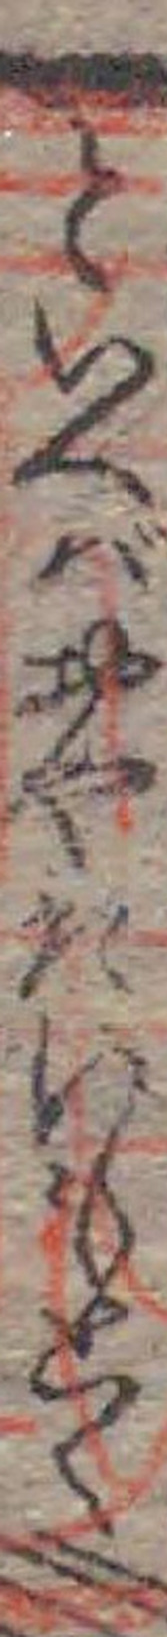といへばおやたちもとく
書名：紺屋百物語 : 3巻
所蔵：国立国会図書館 National Diet Library, JAPAN
